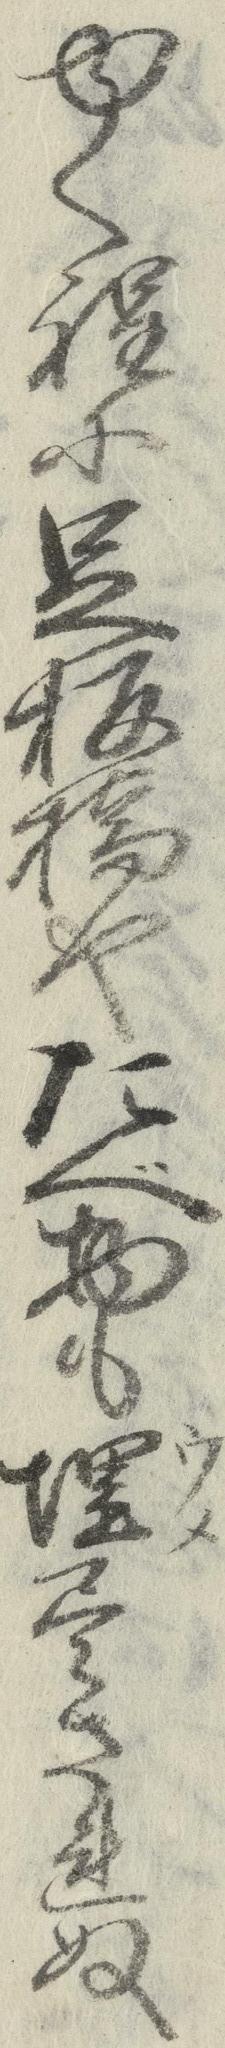ゆく程に足板橋やたべ物も埋尽されぬ
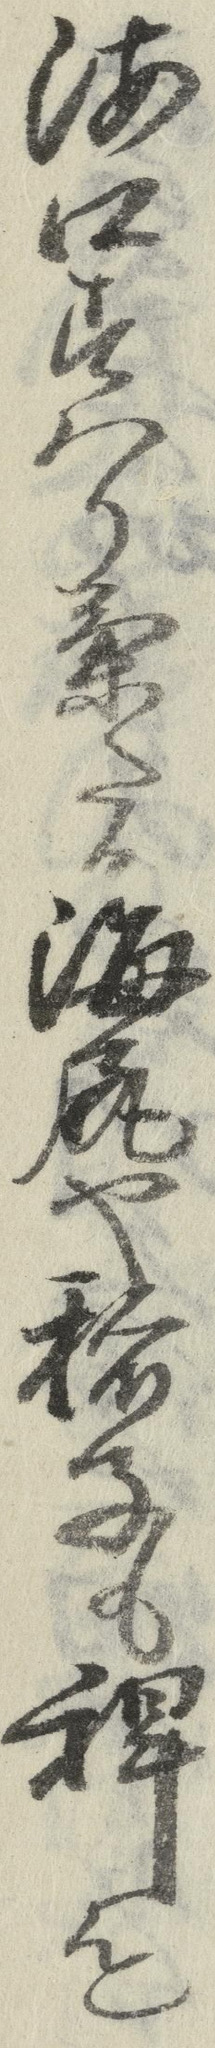海口すはり兼たる海尻や稲子も稗も
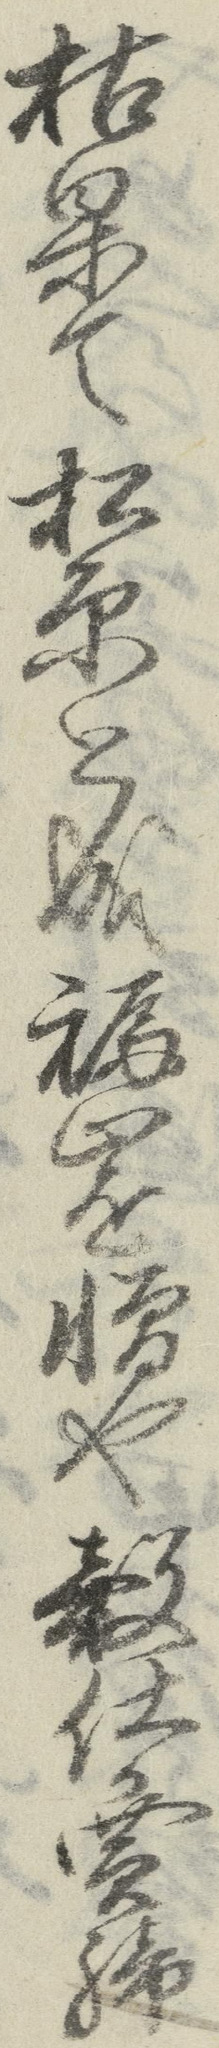枯果て松原と成福山を憎や穀仕る買締
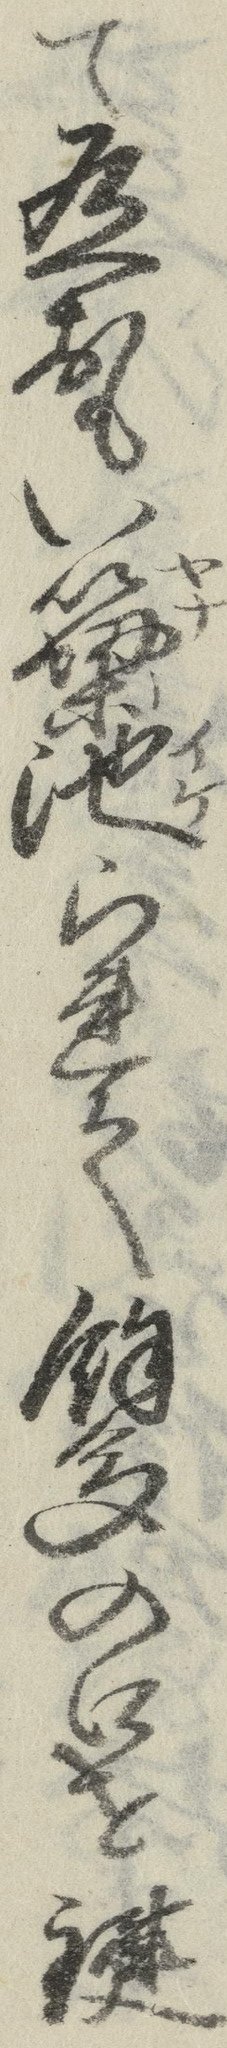て有おもい簗池られて餘多の口を鍵
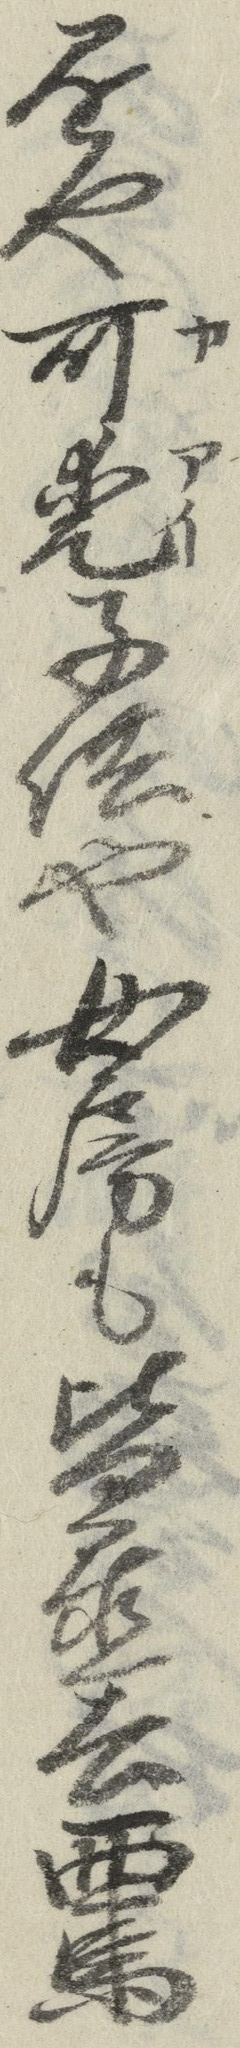懸や可愛子供や女房も皆々置去西馬
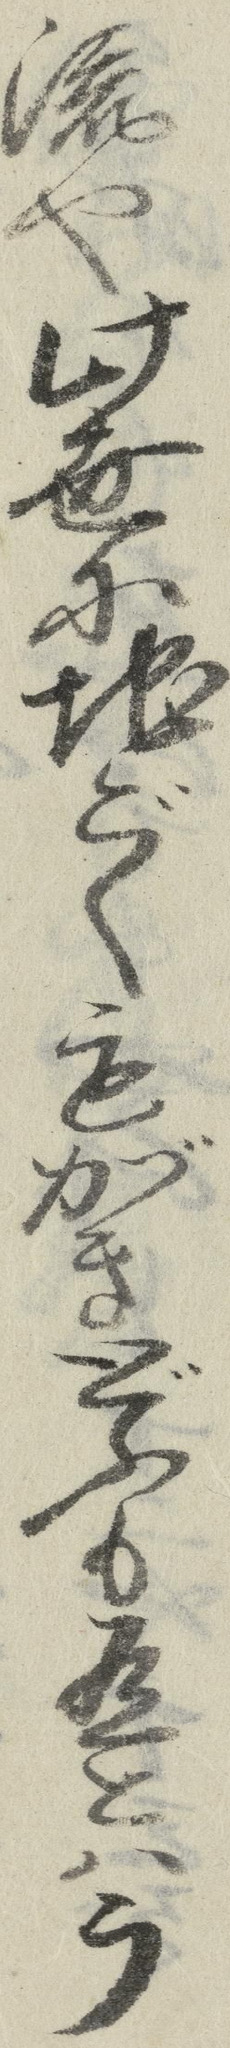流や此世に地ごくもがまどふも有とはう
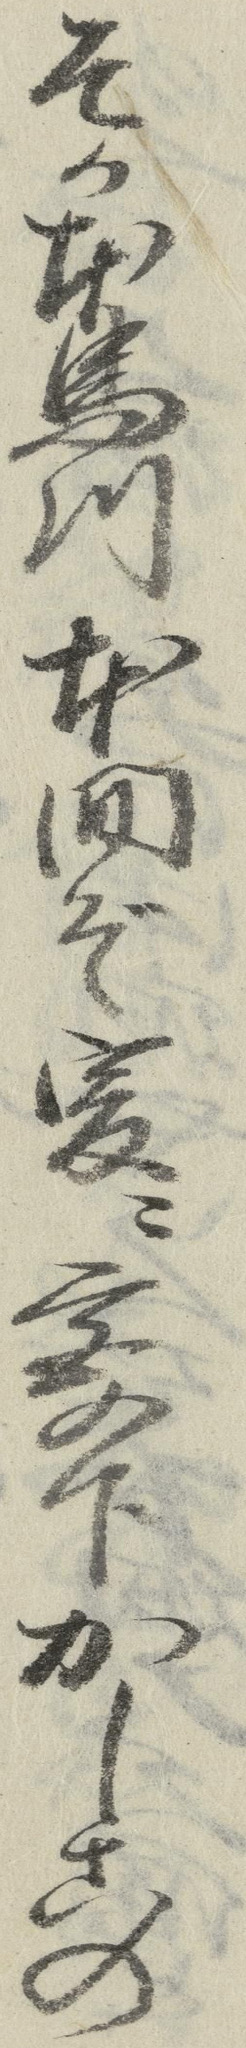そか本馬川本間ぞ爰に宮の下かしこの
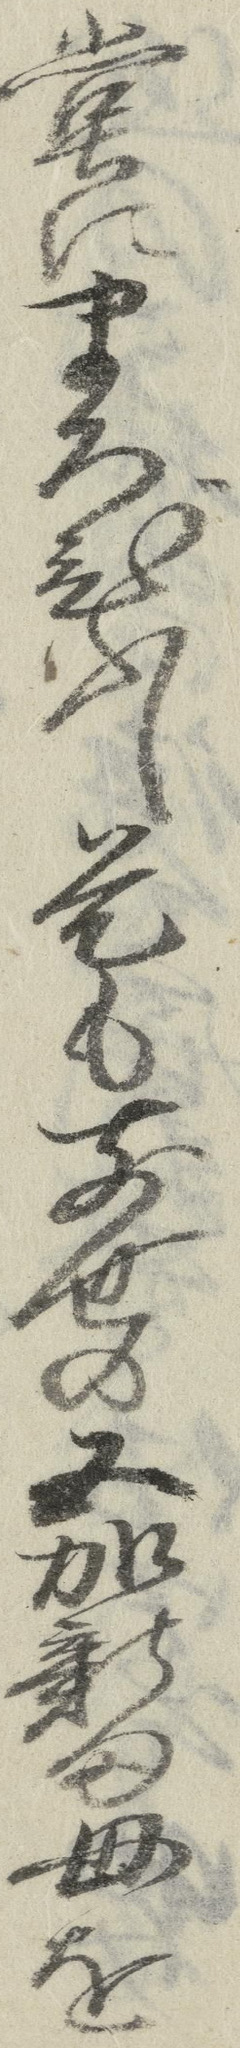堂にまろびふし是も前世の五加新田母を
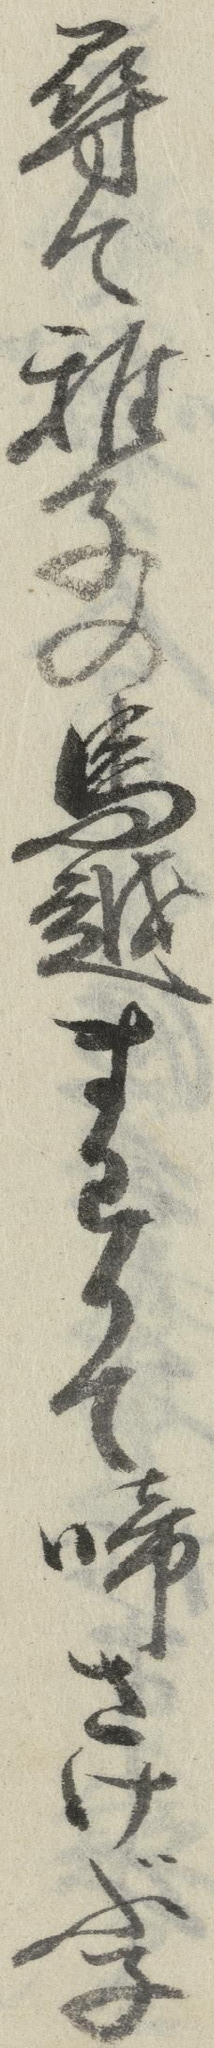尋て稚子の馬越まわりて啼さけぶ子
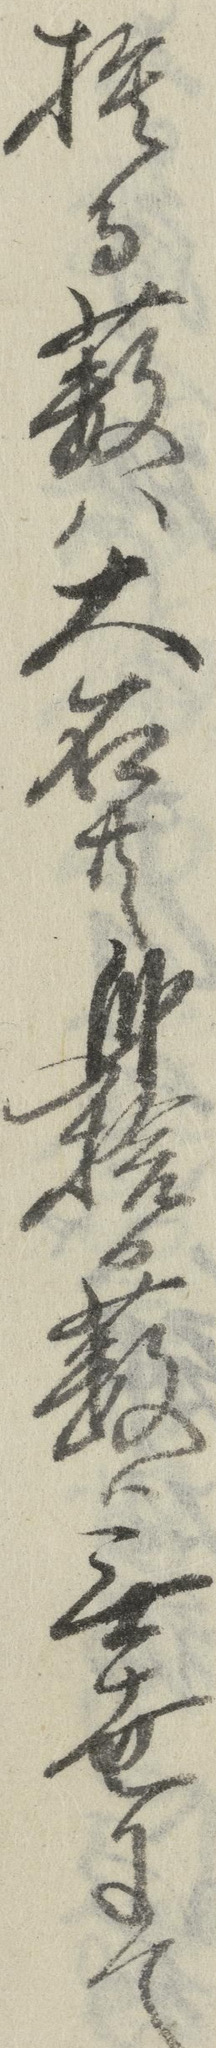捨る薮は大石共身捨ゟ薮は無世にて

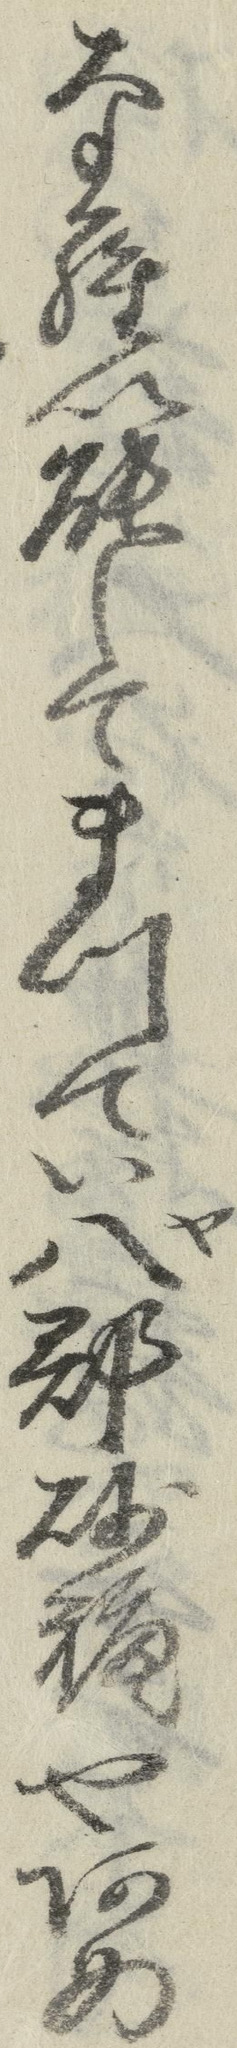ならい能してまつては八郡砂糖やあめ
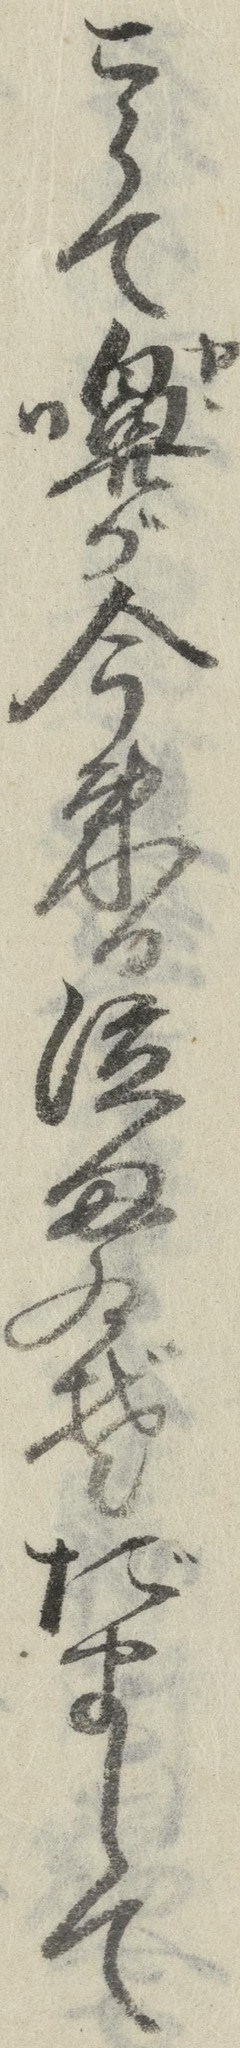こうて嚊が今来る泣まゐぞだまして
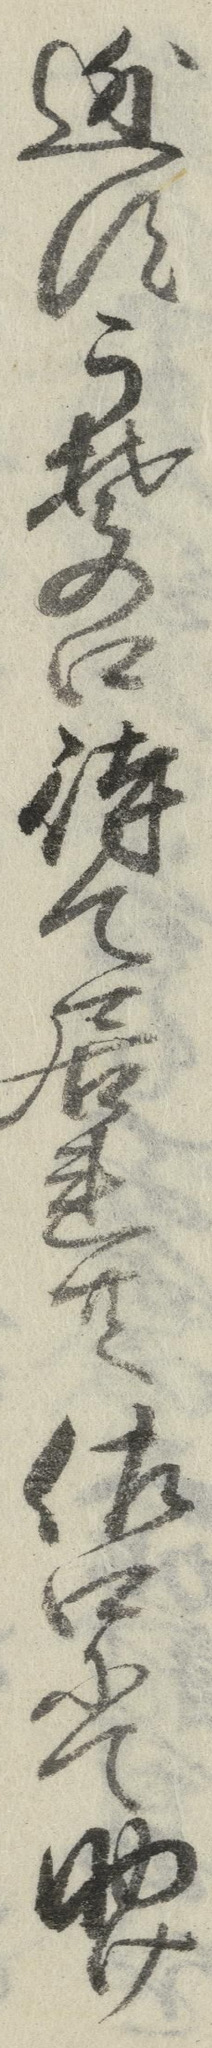迯すうその口待て居れ共佐口にて助け
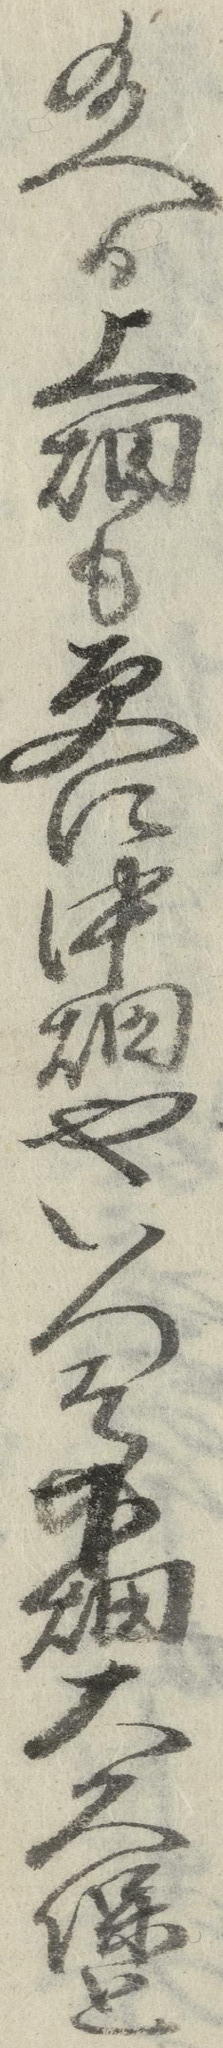給へる上畑も更に中畑やいつそ下畑大久保と
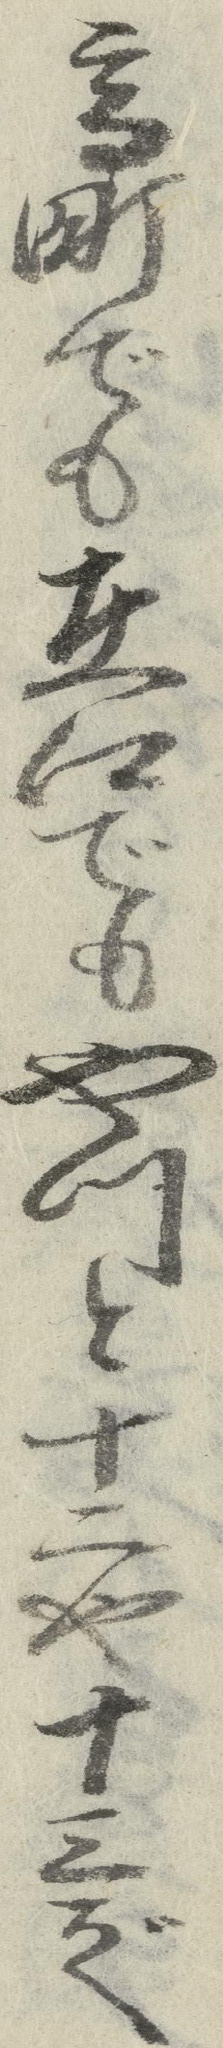高町でも在郷でもやつと十二や十三で
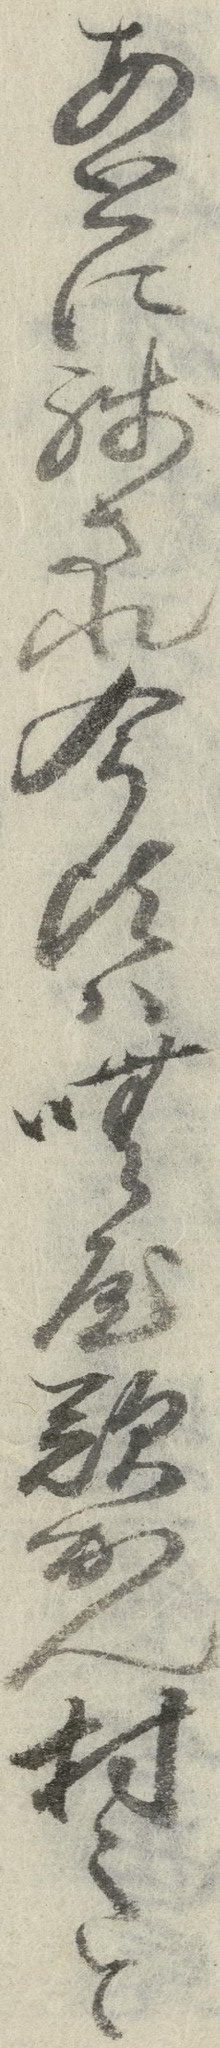あとに残され今頃ハ嘸や歎かん村々と
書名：浅間大焼騒動記　中
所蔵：東京大学地震研究所図書室 Earthquake Research Institute Library, The University of Tokyo, JAPAN
